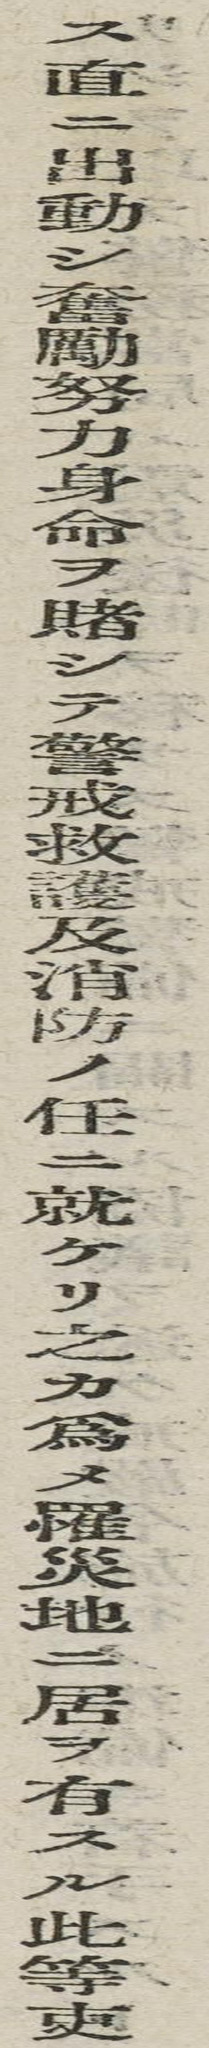ス直ニ出動シ奮励努力身命ヲ賭シテ警戒救護及消防ノ任ニ就ケリ之カ為メ罹災地ニ居ヲ有スル此等吏
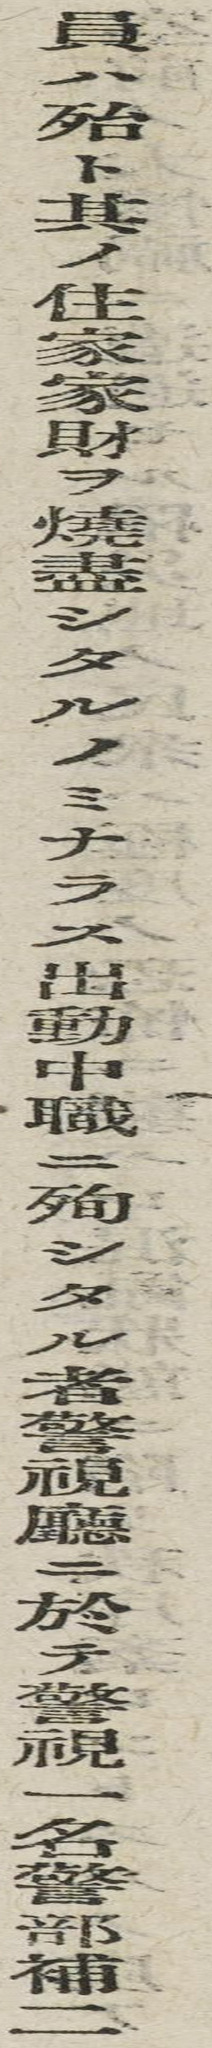員ハ殆ト其ノ住家家財ヲ焼尽シタルノミナラス出動中職ニ殉シタル者警視庁ニ於テ警視一名警部補ニ
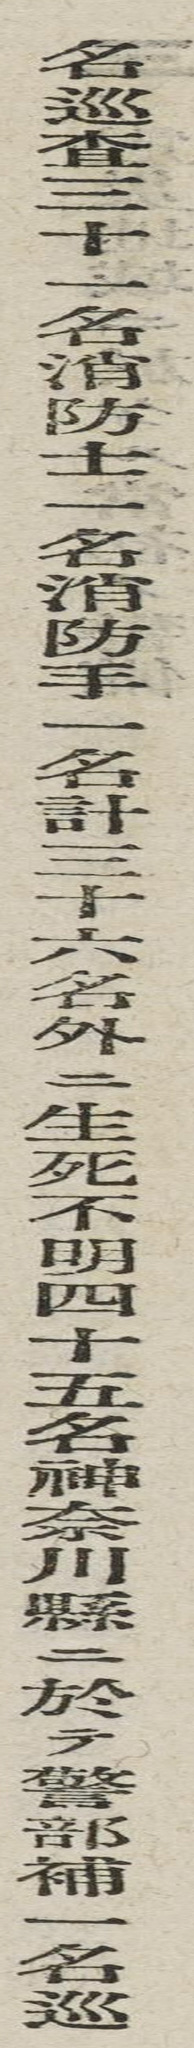名巡査三十一名消防士一名消防手一名計三十六名外ニ生死不明四十五名神奈川県ニ於テ警部補一名巡
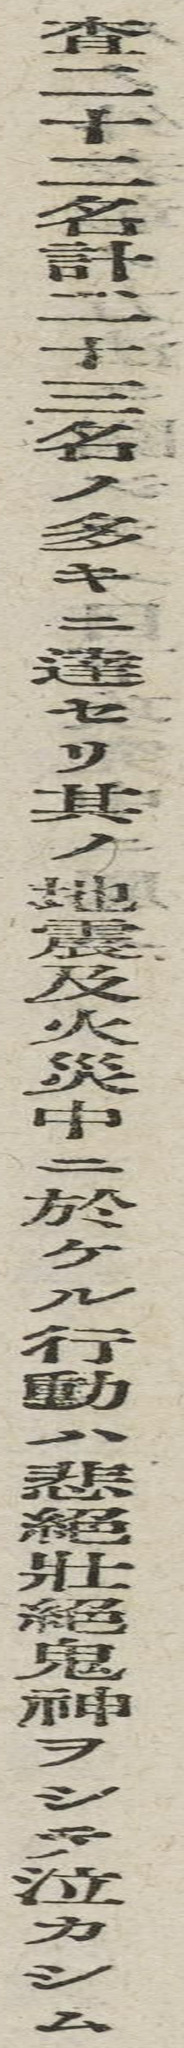査二十二名計二十三名ノ多キニ達セリ其ノ地震及火災中ニ於ケル行動ハ悲絶壮絶鬼神ヲシテ泣カシム
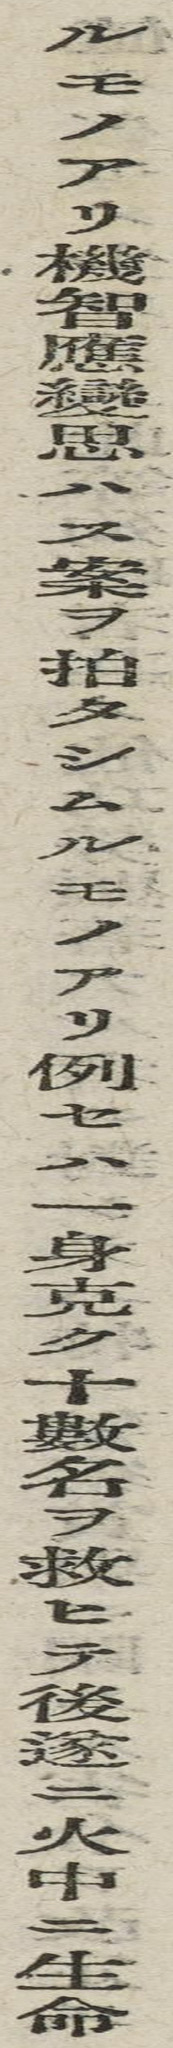ルモノアリ機智応変思ハス案ヲ拍クシムルモノアリ例セハ一身克ク十数名ヲ救ヒテ後遂ニ火中ニ生命
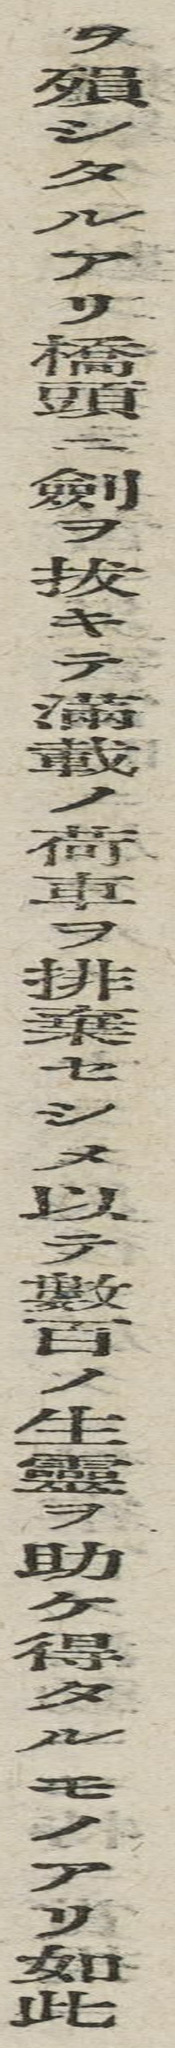ヲ殞シタルアリ橋頭ニ剣ヲ抜キテ満載ノ荷車ヲ排棄セシメ以テ数百ノ生霊ヲ助ケ得タルモノアリ如此

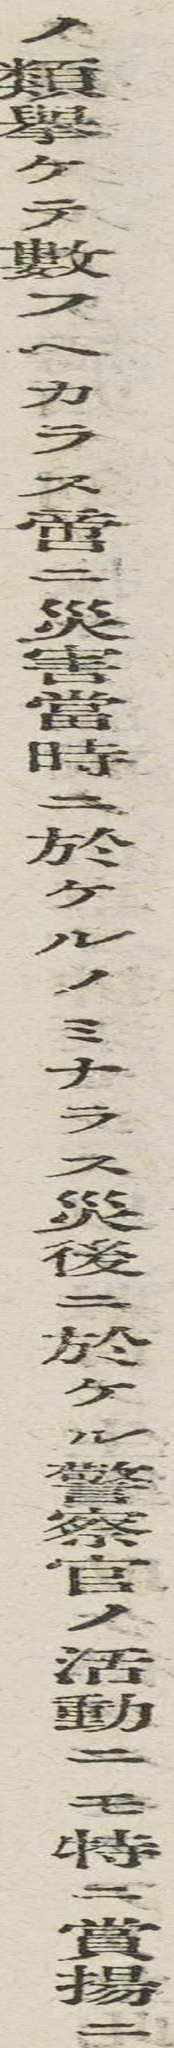ノ類挙ケテ数フヘカラス啻ニ災害当時ニ於ケルノミナラズ災後ニ於ケル警察官ノ活動ニモ特ニ賞揚ニ
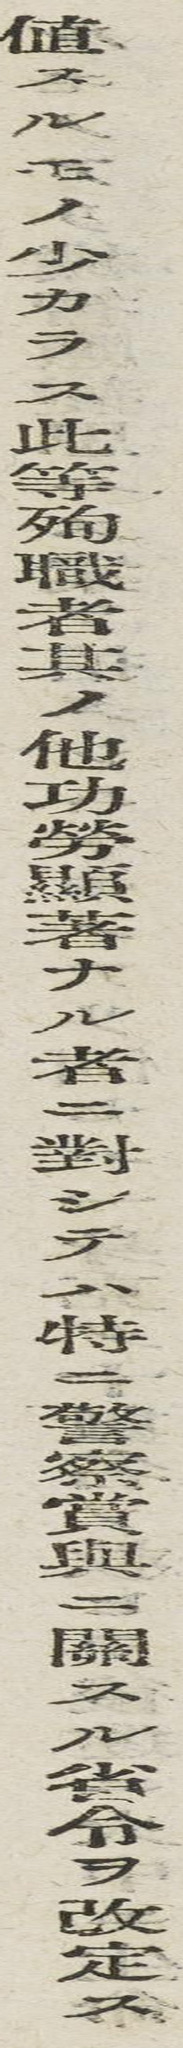価スルモノ少カラス此等殉職者其ノ他功労顕著ナル者ニ対シテハ特ニ警察賞与ニ関スル省令ヲ改定ス
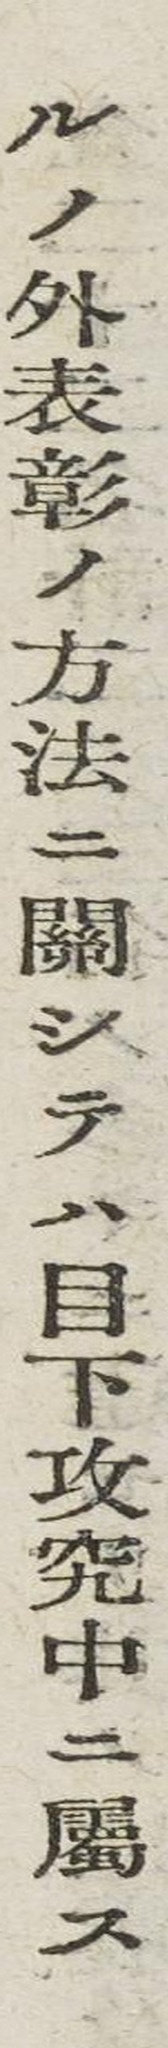ルノ外表彰ノ方法ニ関シテハ目下攻究中ニ属ス
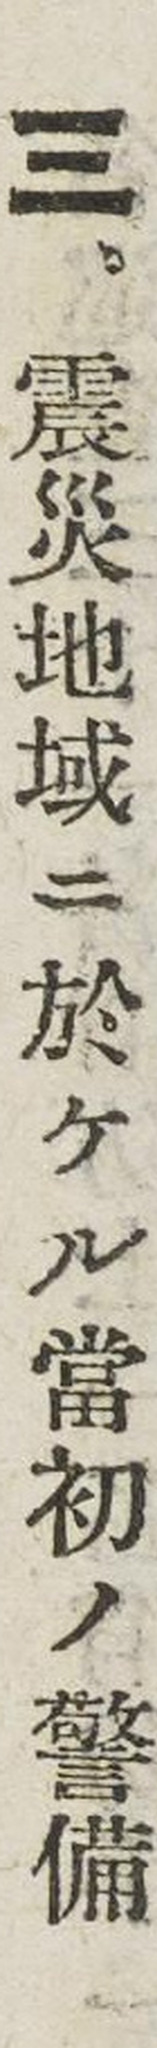三、震災地域ニ於ける当初ノ警備
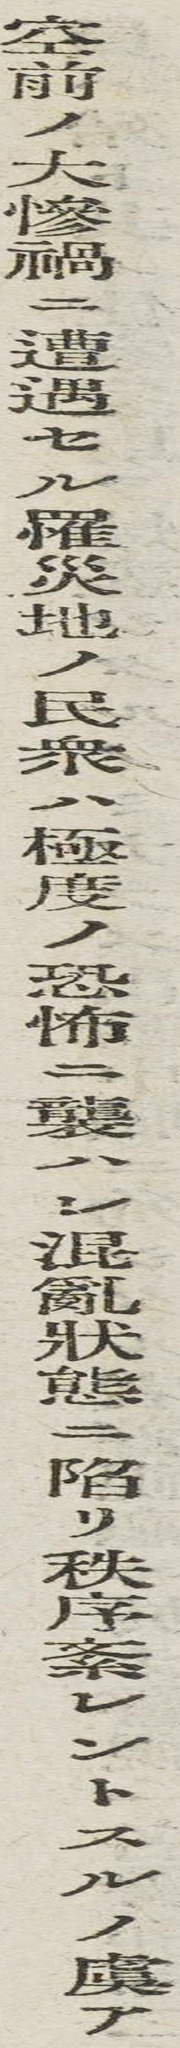空前ノ大惨禍ニ遭遇セル罹災地ノ民衆ハ極度ノ恐怖ニ襲ハレ混乱状態ニ陥リ秩序紊レントスルノ虞ア
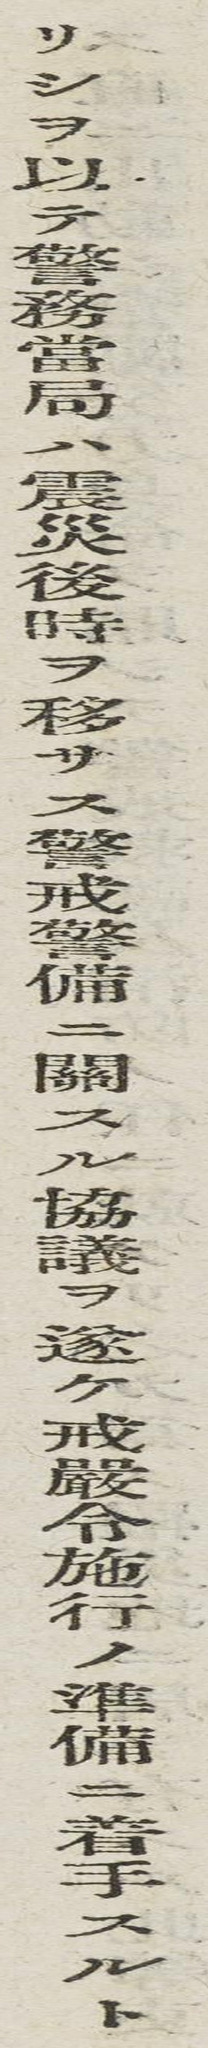リシヲ以テ警務当局ハ震災後時ヲ移サス警戒警備ニ関スル協議ヲ遂ケ戒厳令施行ノ準備ニ着手スルト
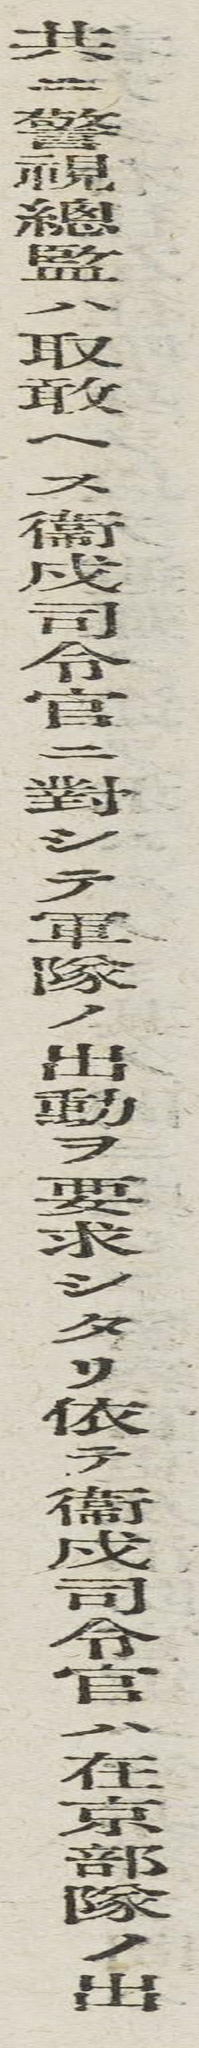共ニ警視総監ハ取敢ヘス衞戌司令官ニ対シテ軍隊ノ出動ヲ要求シタリ依テ衞戌司令官ハ在京部隊ノ出
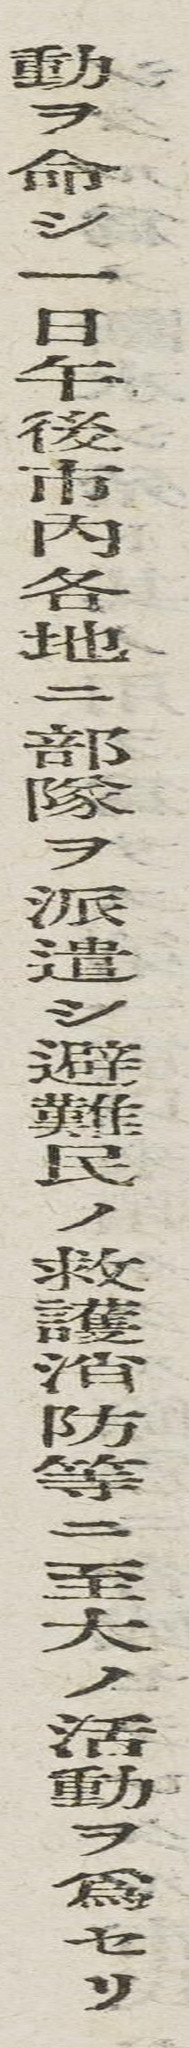動ヲ命シ一日午後市内各地ニ部隊ヲ派遣シ避難民ノ救護消防等ニ至大ノ活動ヲ為セリ
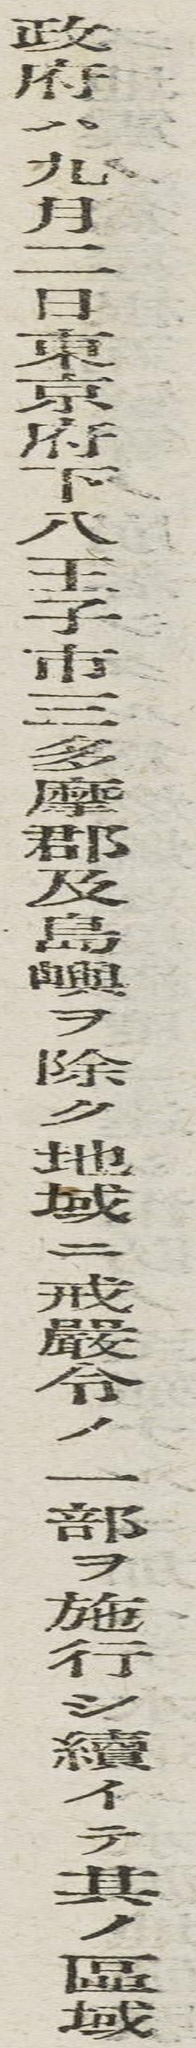政府ハ九月二日東京府下八王子市三多摩郡及島嶼ヲ除ク地域ニ戒厳令ノ一部ヲ施行シ続イテ其ノ区域
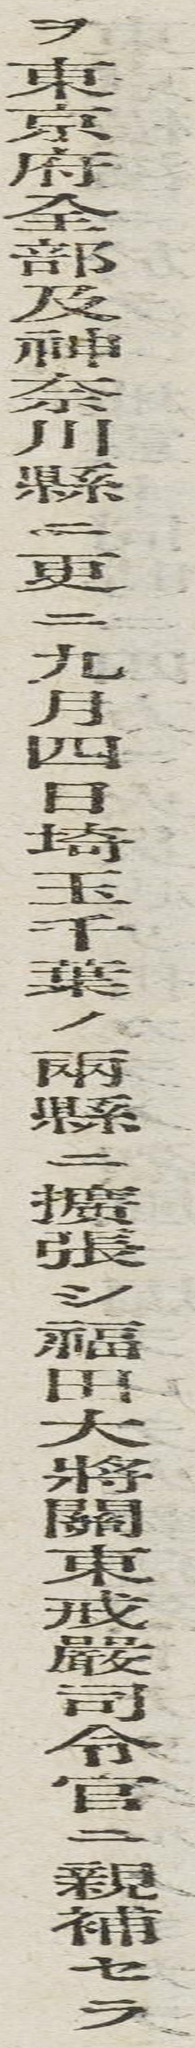ヲ東京府全部及神奈川県ニ更ニ九月四日埼玉千葉ノ両県ニ拡張シ福田大将関東戒厳司令官ニ親補セラ
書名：震災被害状況並救護施設概要
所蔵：東京大学地震研究所図書室 Earthquake Research Institute Library, The University of Tokyo, JAPAN
